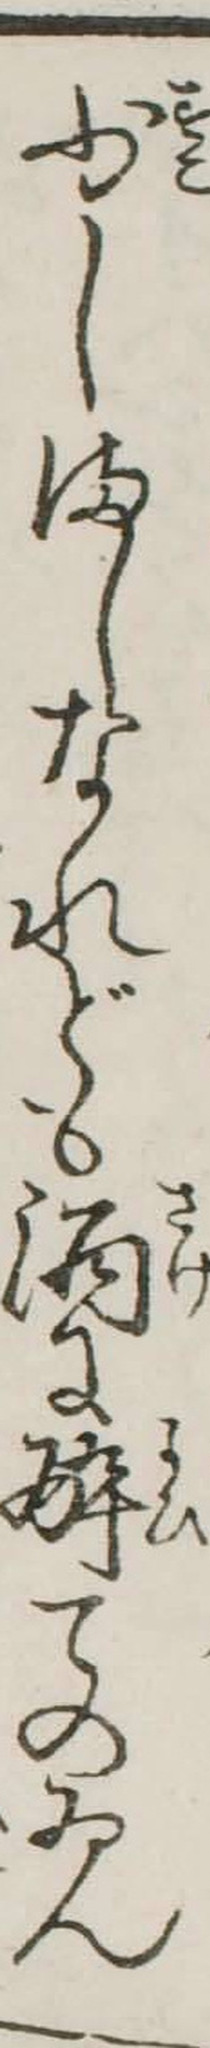少しましなれども酒に酔てのゐん
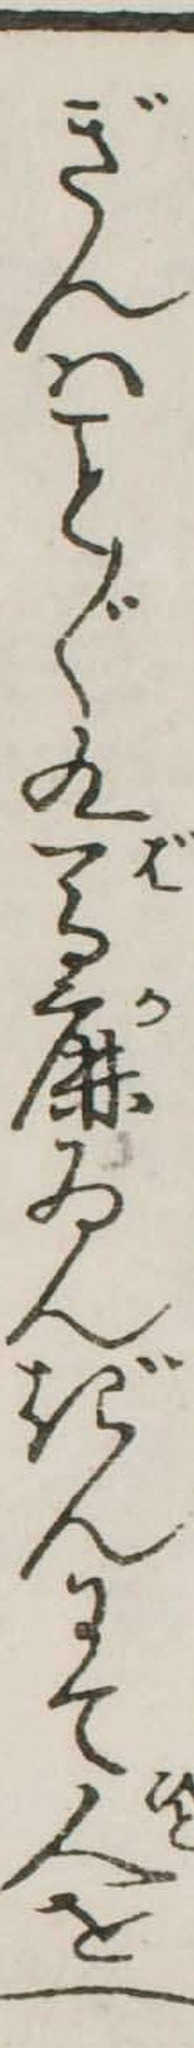ぎんはこと〴〵く馬鹿ゐんぎんにて人を
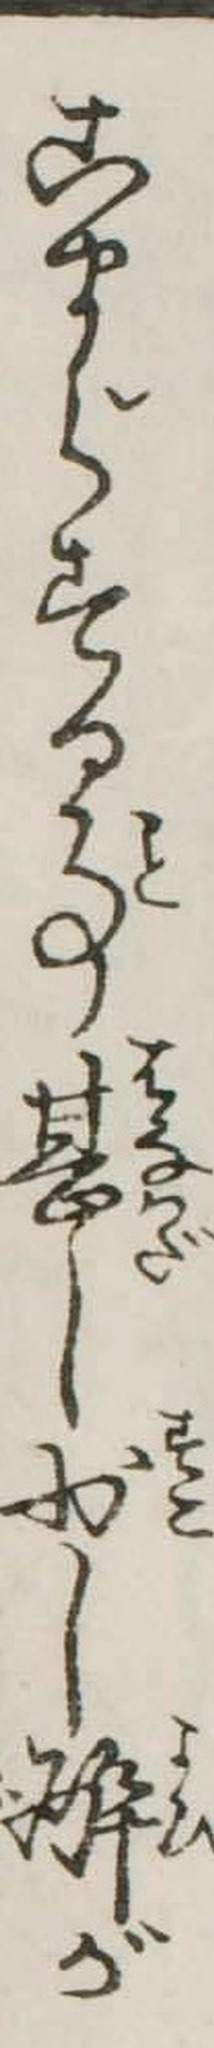こまらする事甚し少し酔が
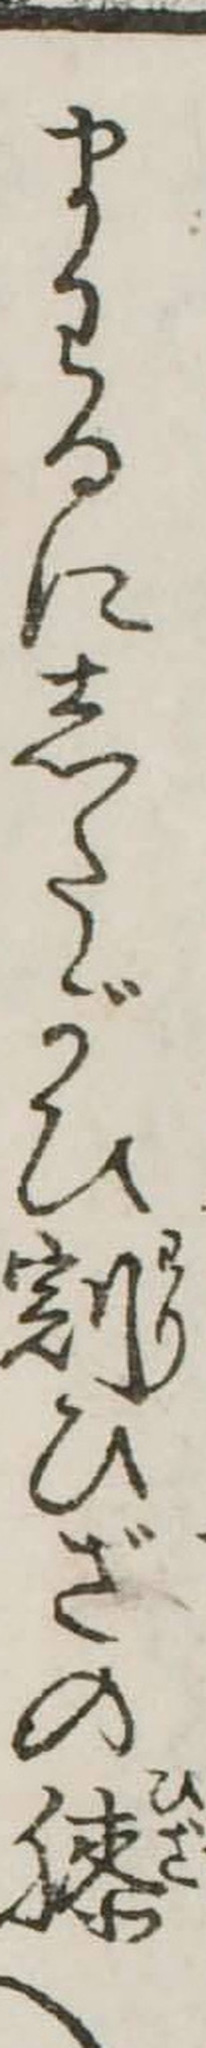まわるにしたがひ割ひざの膝
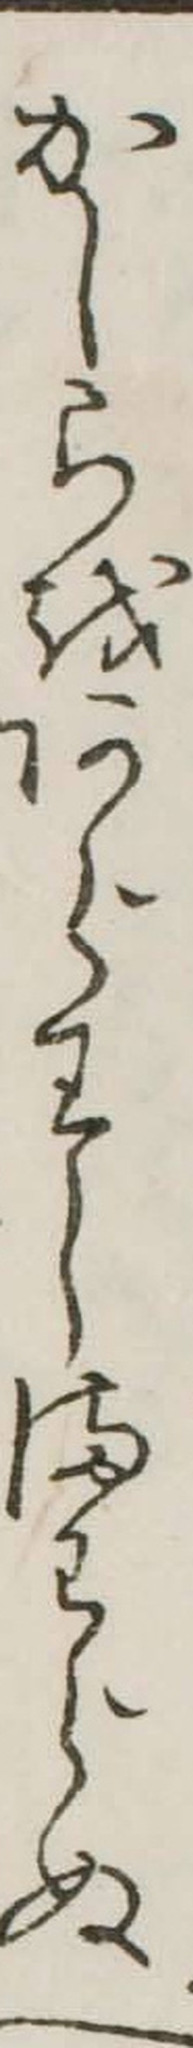かしらをあらわしまわらぬ
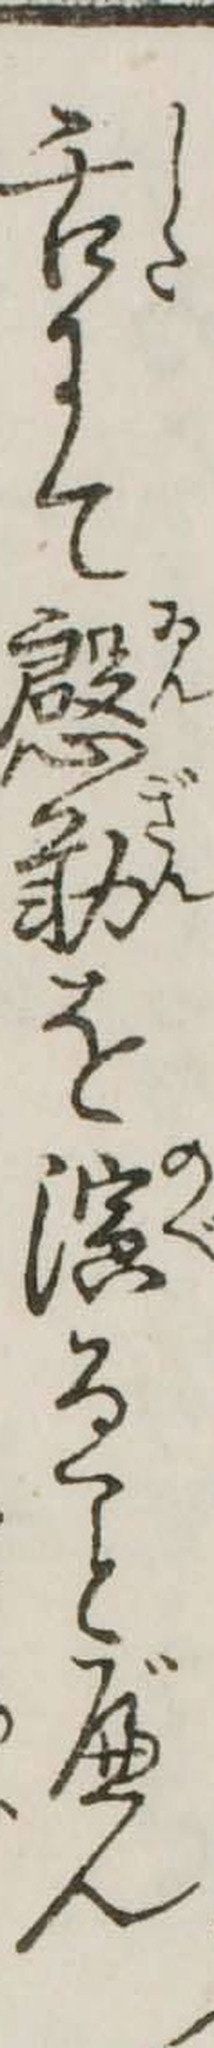舌にて慇勤を演ることべん
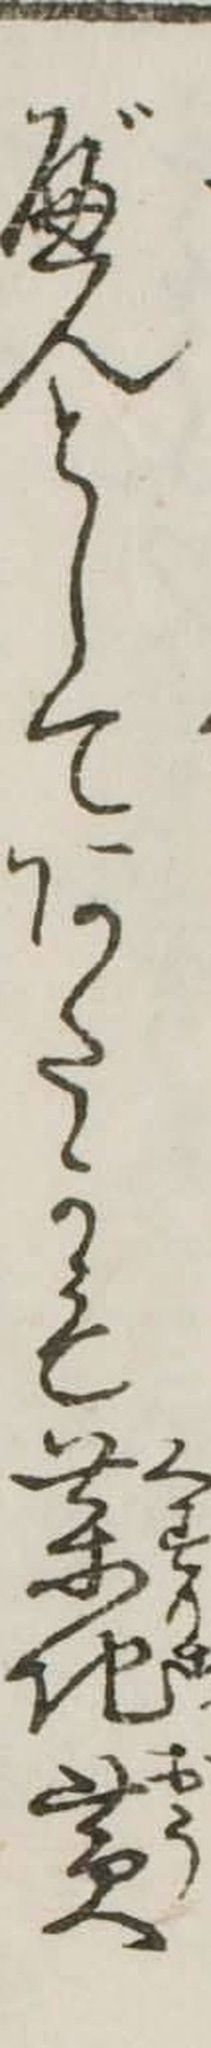べんとしてあたかも薬地黄
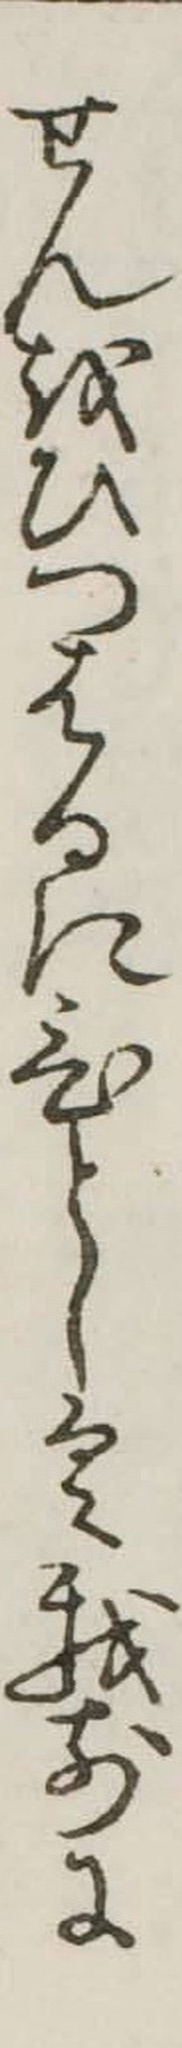せんをひつはるにひとしく我前に
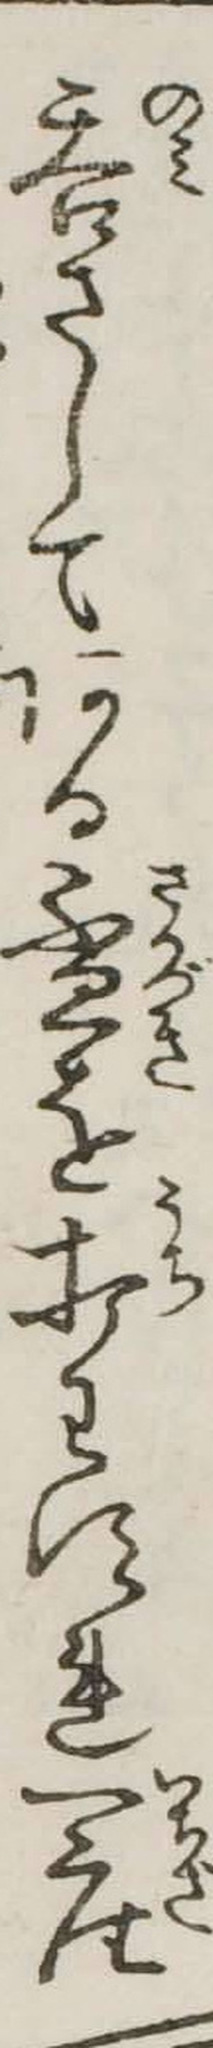呑さしてある盃を打わすれ一座
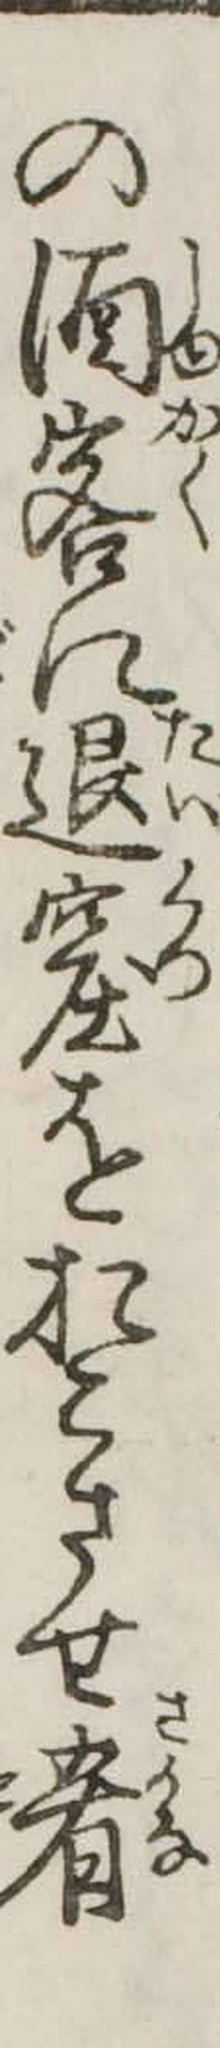の酒客に退窟をおこさせ肴
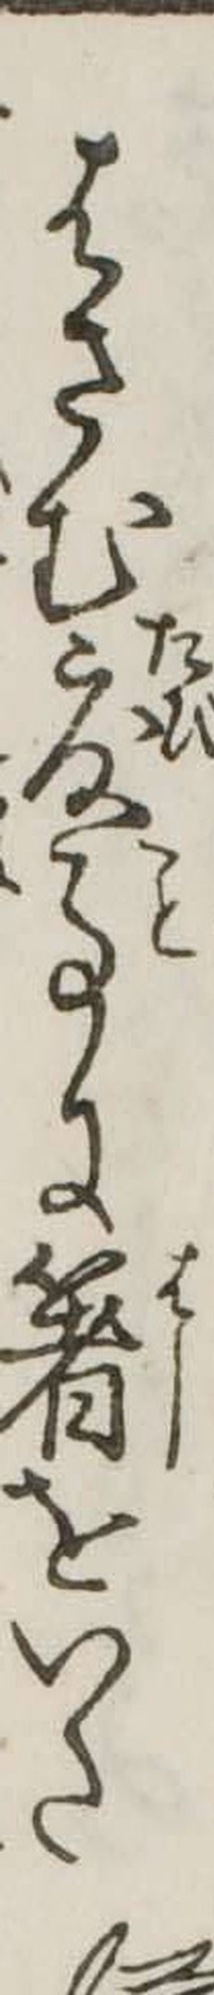はさむ度事に箸をいた
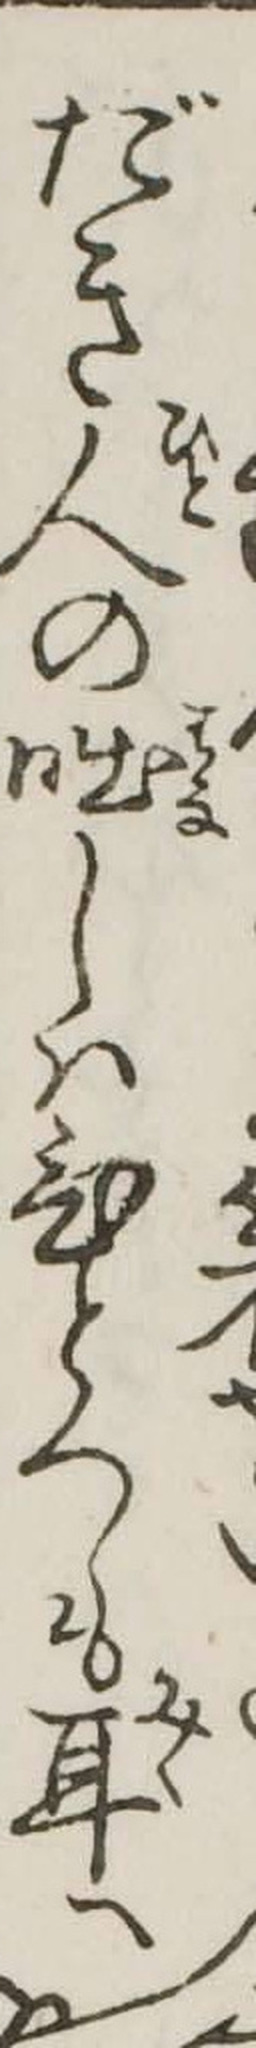だき人の咄しはひとつも耳へ
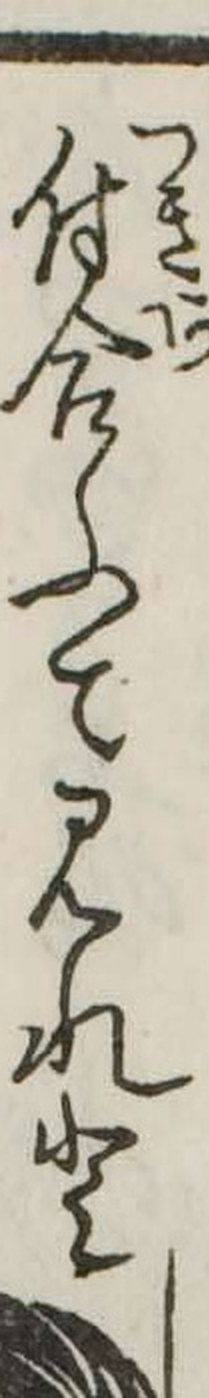付合ふて見れと
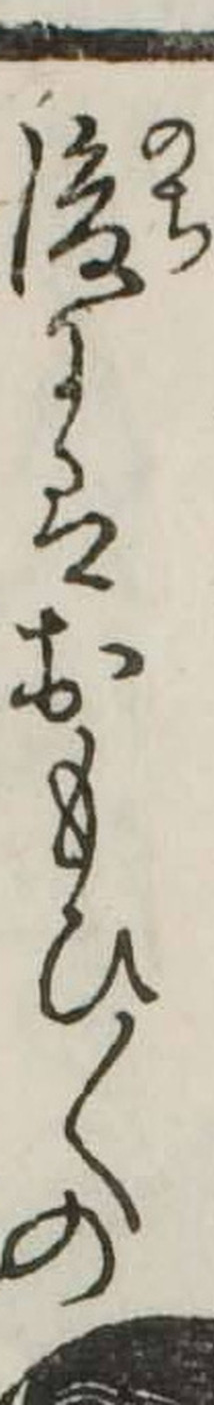後にはおもひ〳〵の
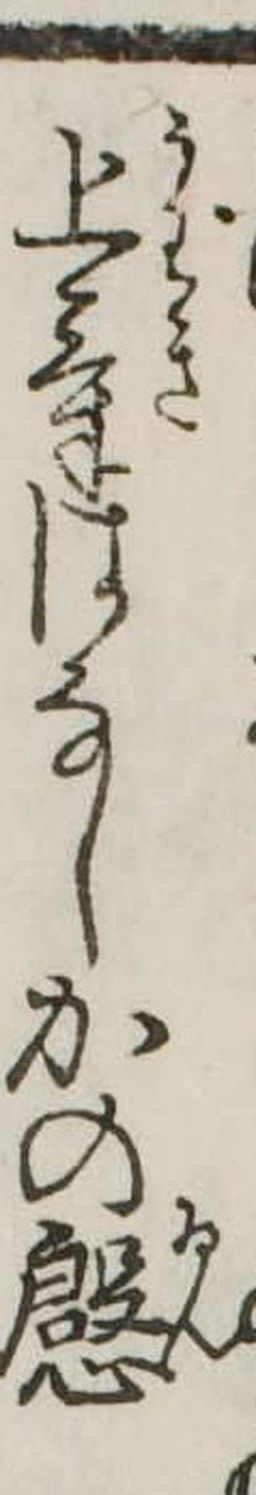上気はなしかの慇
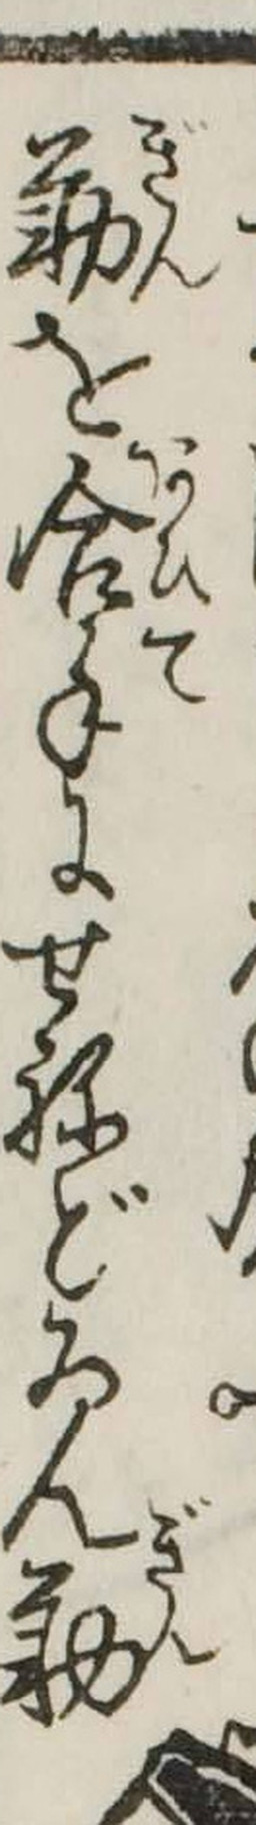勤を合手にせねどゐん勤
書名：繪本不盡泉
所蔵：国文学研究資料館
